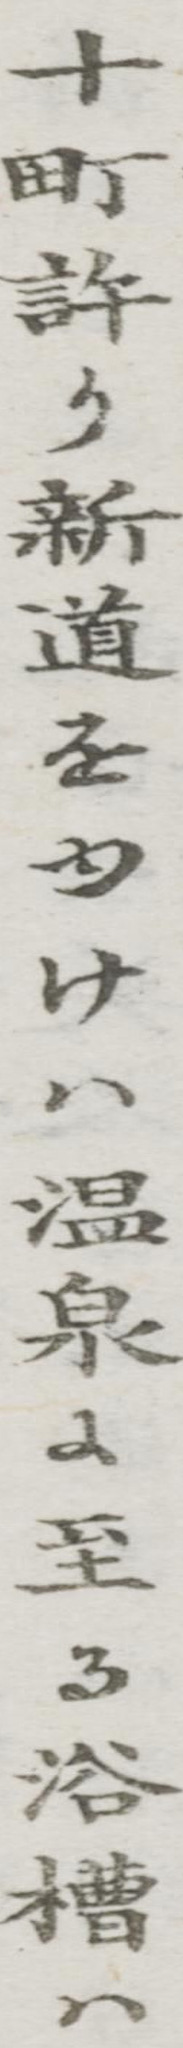十町許り新道をゆけは温泉に至る浴槽は
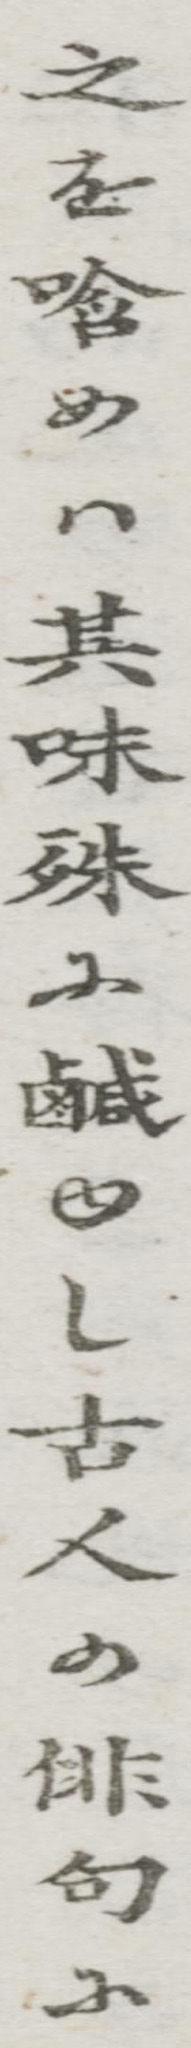之を唅めは其味殊に鹹ゆし古人の俳句に
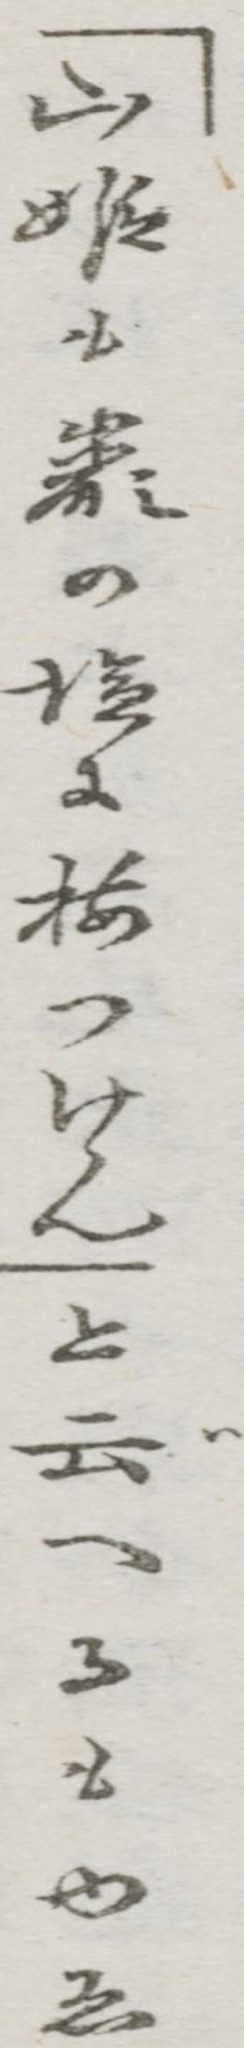「山姫も巌の塩に梅つけん」と云へるもゆゑ
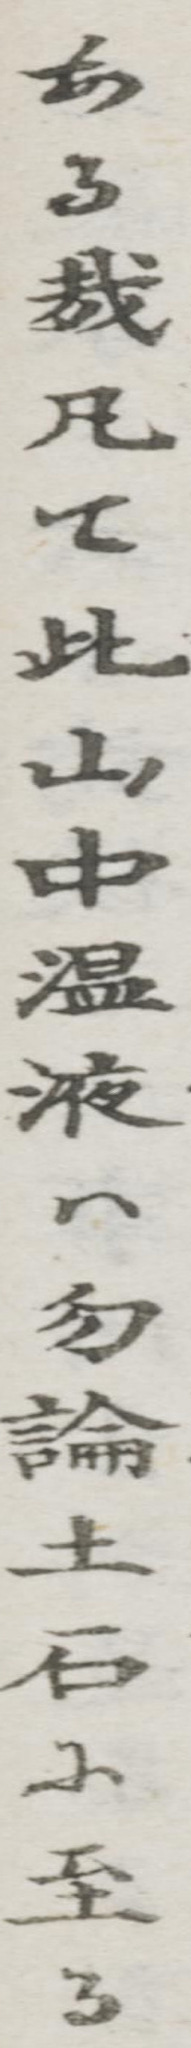ある哉凡て此山中温液は勿論土石に至る
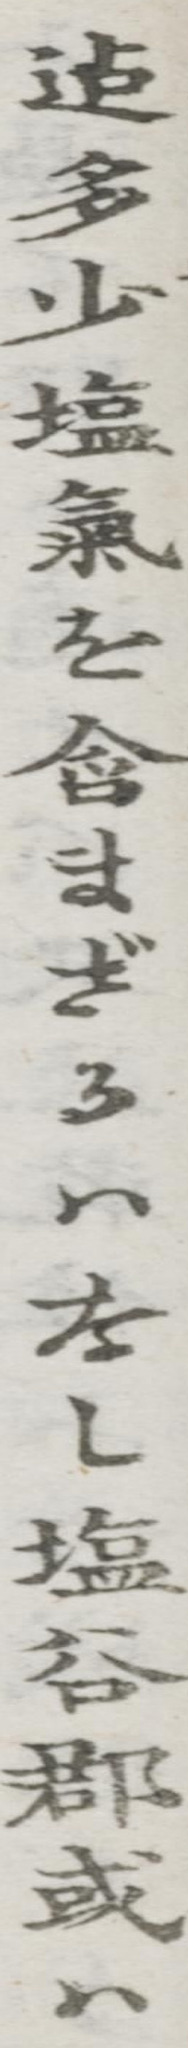迠多少塩氣を含まざるはなし塩谷郡或は
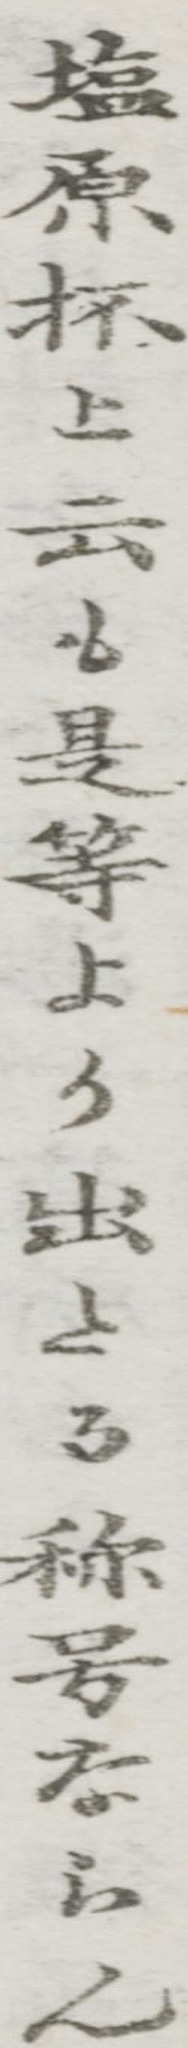塩原抔と云も是等より出たる称号ならん
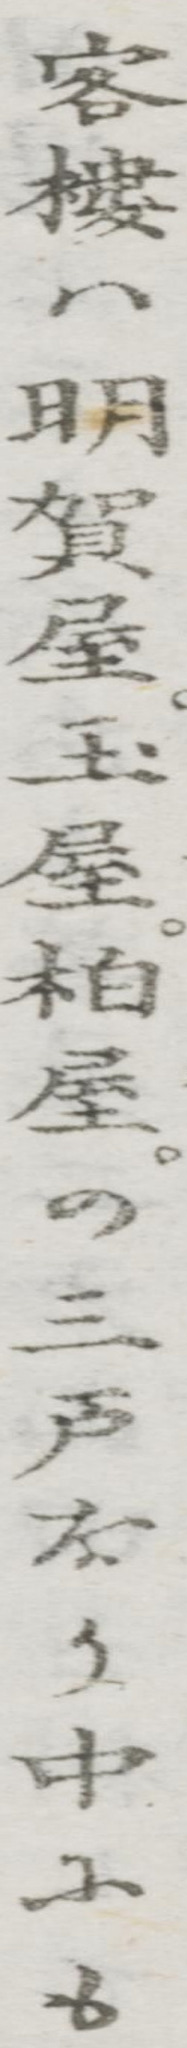客樓は明賀屋。玉屋。柏屋。の三戸なり中にも
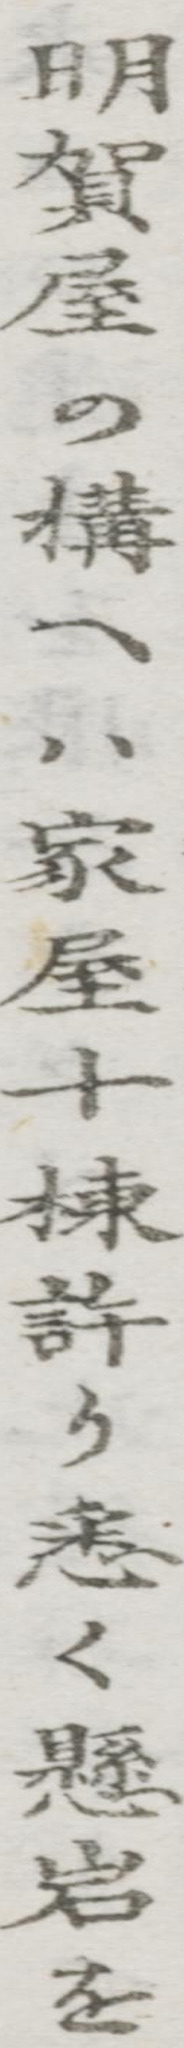明賀屋の構へは家屋十棟許り悉く懸岩を
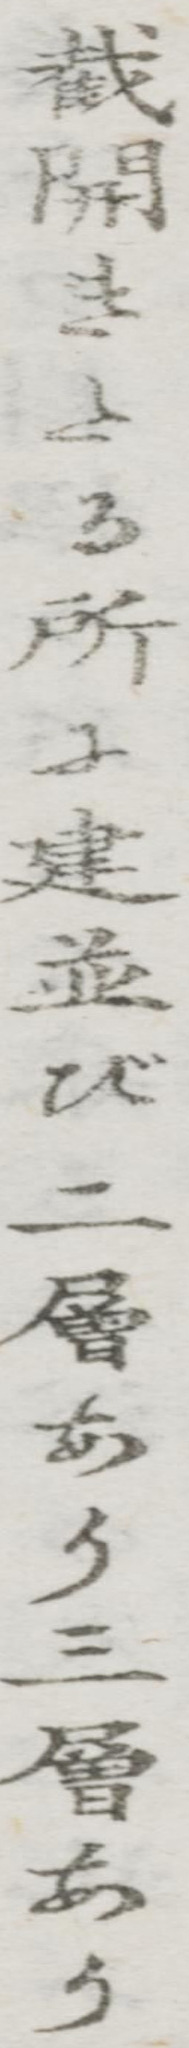截開きたる所に建並び二層あり三層あり
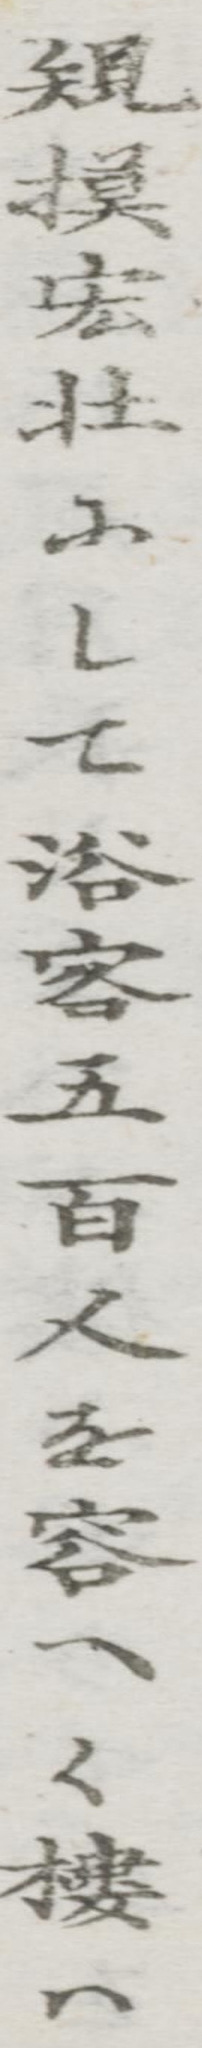規模宏壮にして浴客五百人を容へく樓は
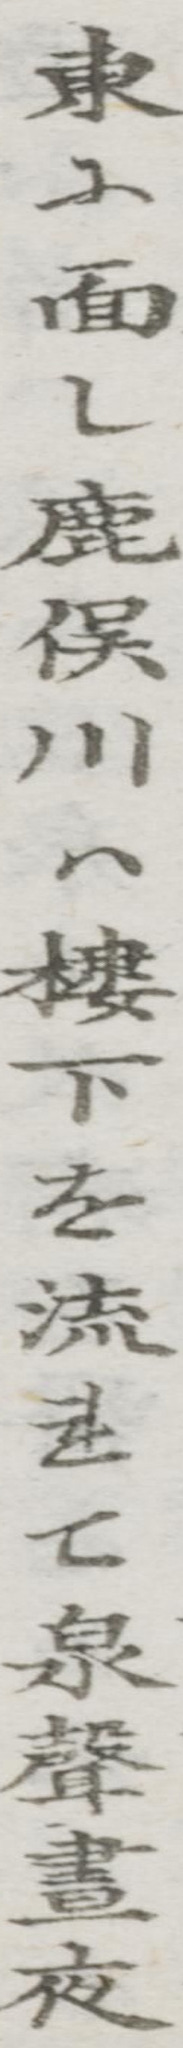東に面し鹿俣川は樓下を流れて泉聲晝夜
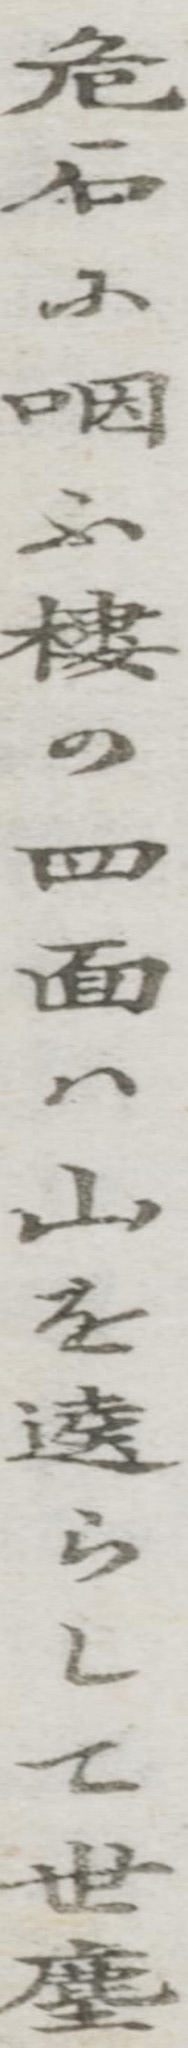危石に咽ふ樓の四面は山を遶らして世塵

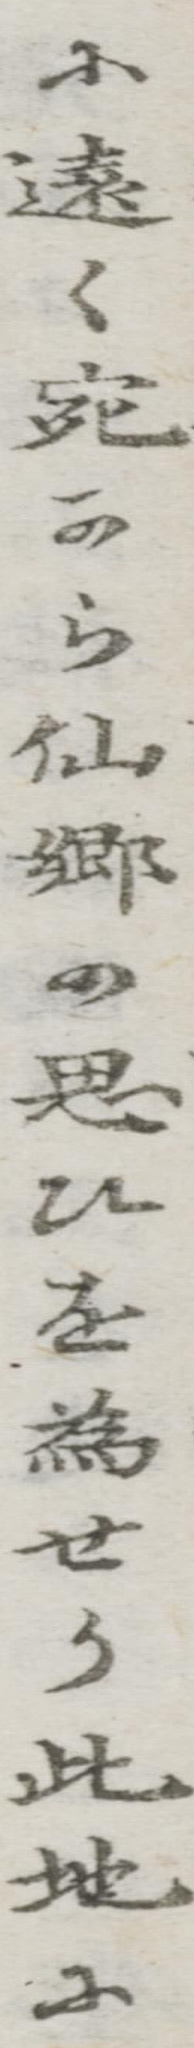に遠く宛から仙郷の思ひを為せり此地に
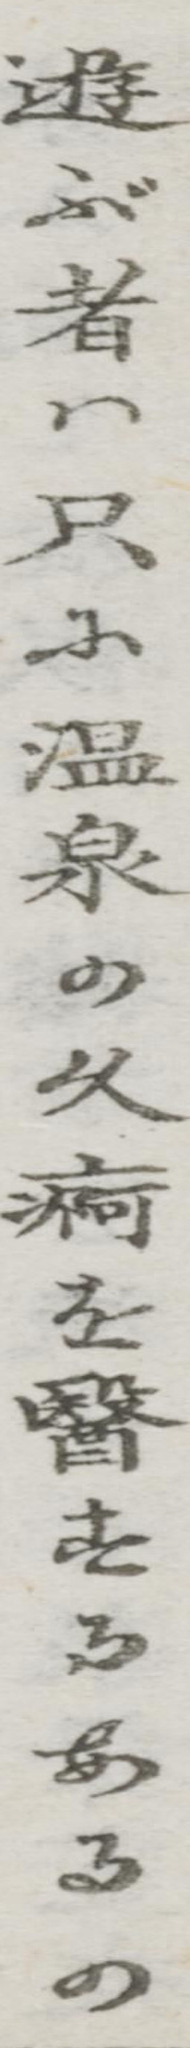遊ぶ者は只に温泉の久痾を醫するあるの
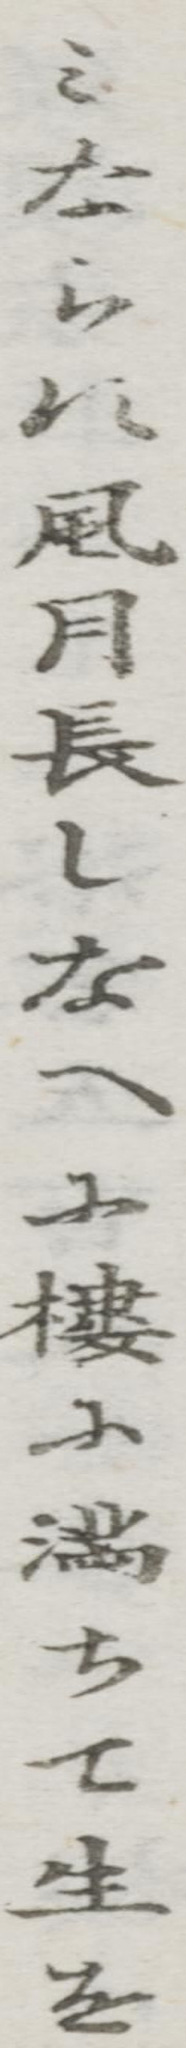みならす風月長しなへに樓に満ちて生を
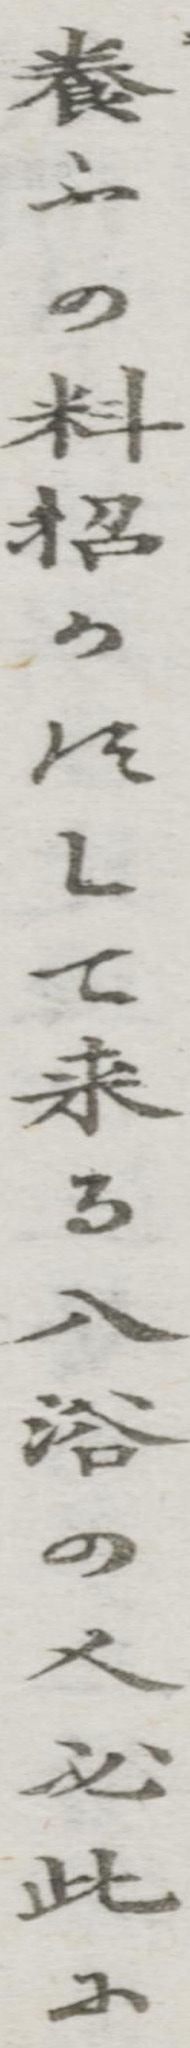養ふの料招かすして来る入浴の人必此に
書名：塩原繁昌記　全
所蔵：東京大学地震研究所図書室 Earthquake Research Institute Library, The University of Tokyo, JAPAN
